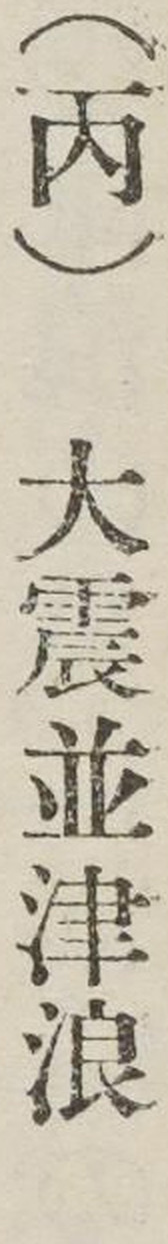大震並津浪
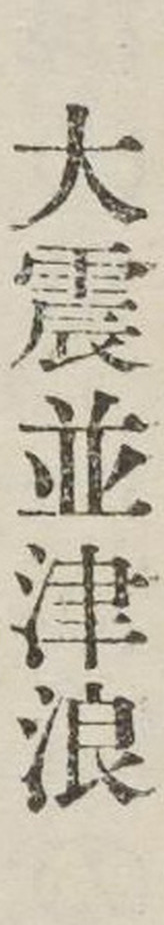大震並津浪
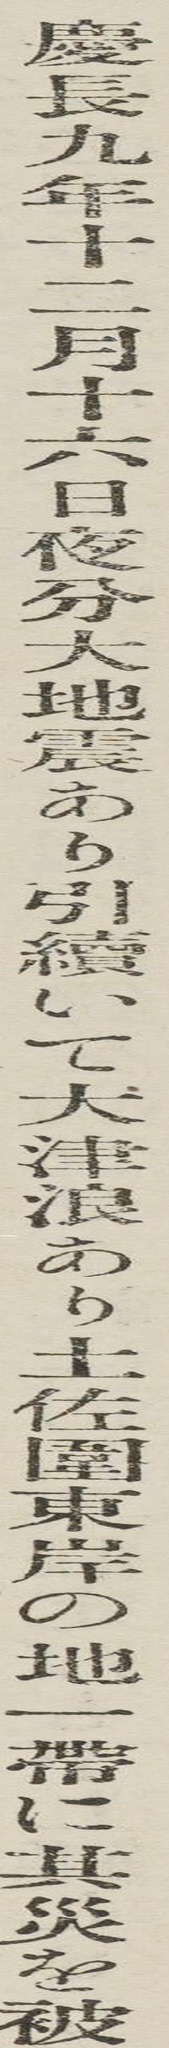慶長九年十二月十六日夜分大地震あり引続いて大津浪あり土佐圍東岸の地一帯に其災を被
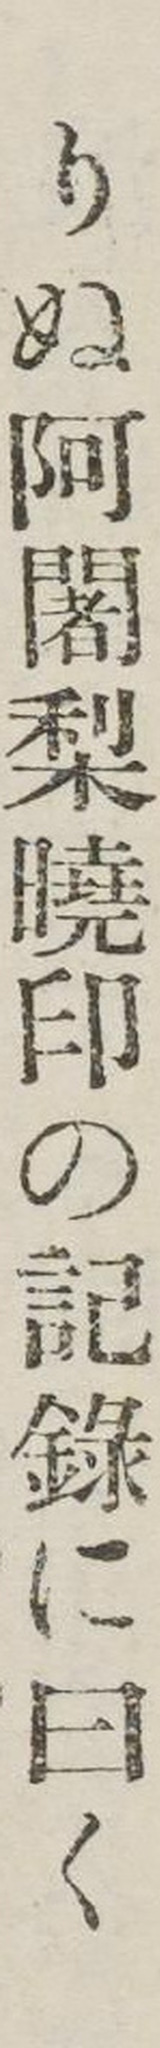りぬ阿闍梨暁印の記録に曰く
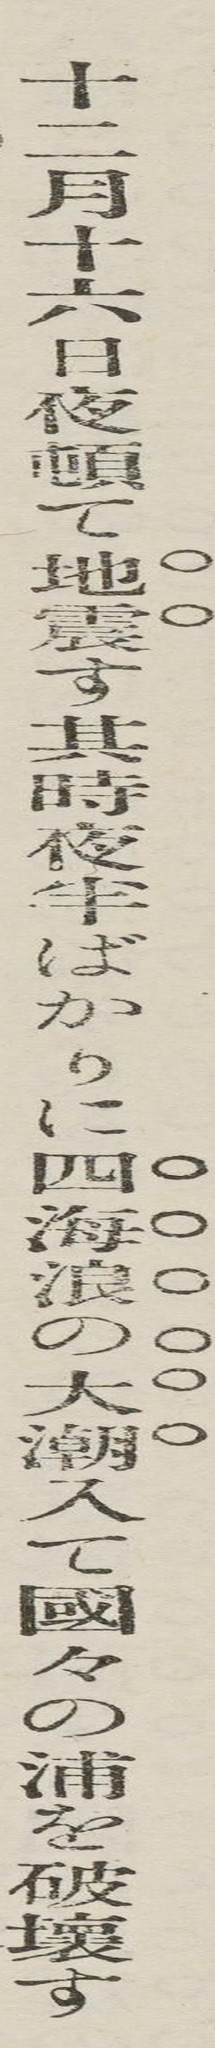十二月十六日夜頓て地震す其時夜半ばかりに四海浪の大潮入て国々の浦を破壊す
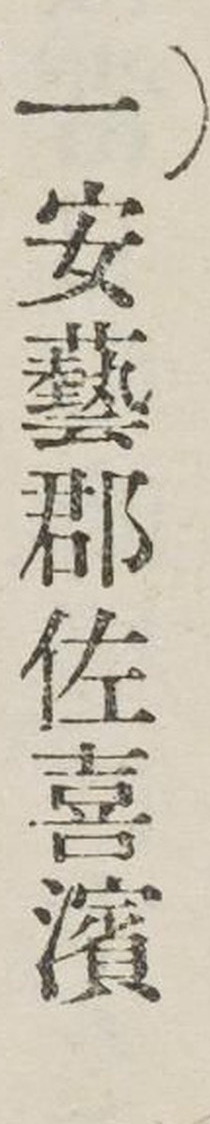㈠安芸郡佐喜浜
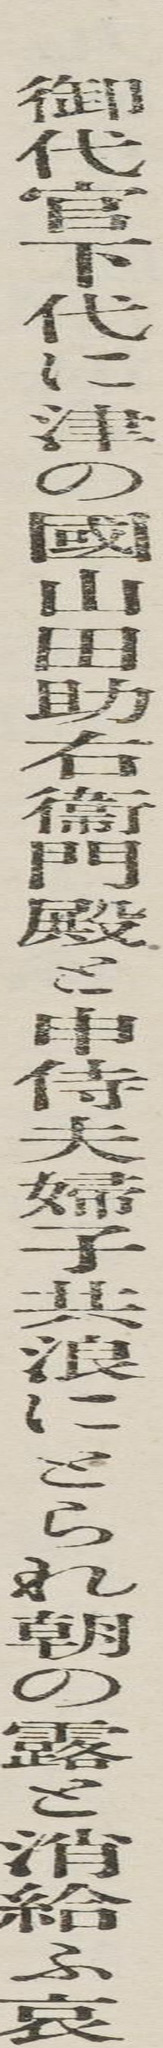御代官下代に津の国山田助右衛門殿と申侍夫婦子共浪にとられ朝の露と消給ふ哀
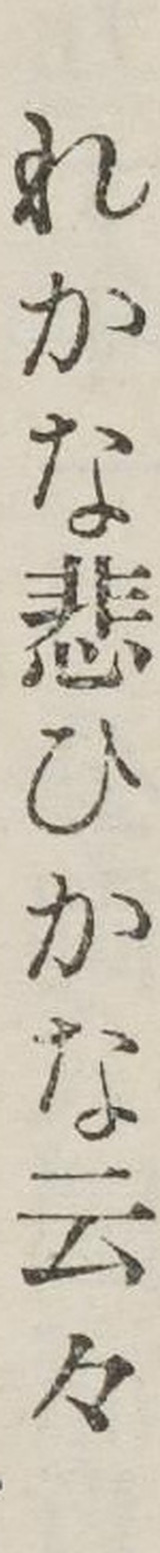れかな悲ひかな云々
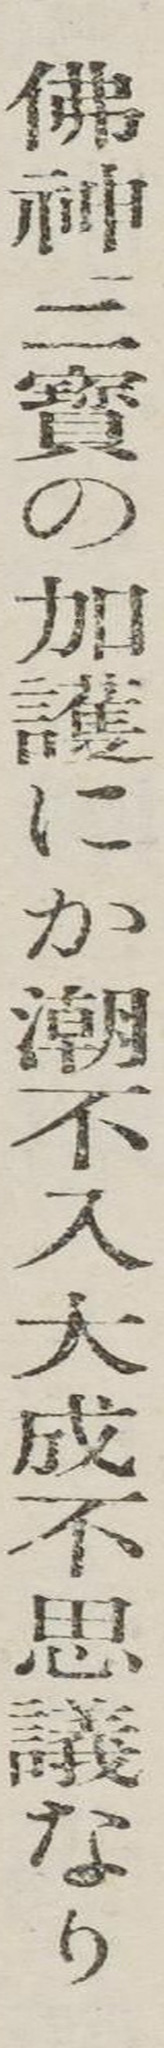仏神二宝の加護にか潮不入大成不思議なり
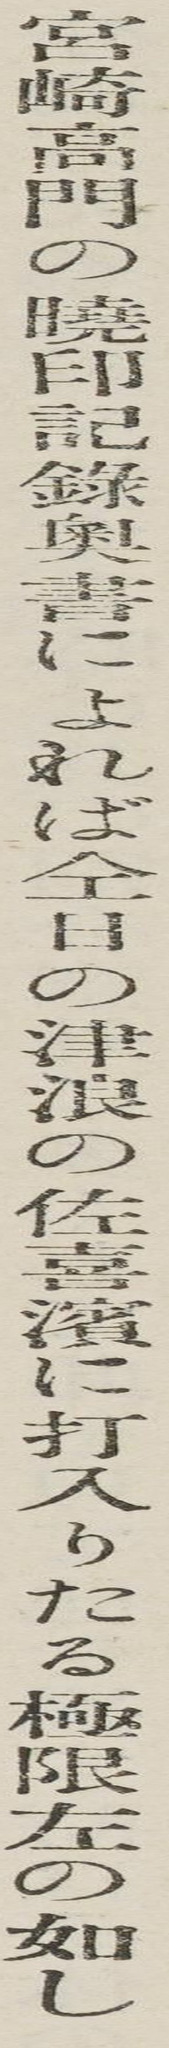宮崎高門の暁印記録奥書によれば同日の津浪の佐喜浜に打入りたる極限左の如し
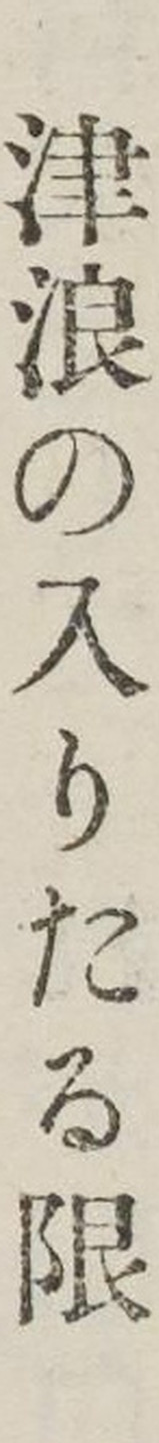津浪の入りたる限
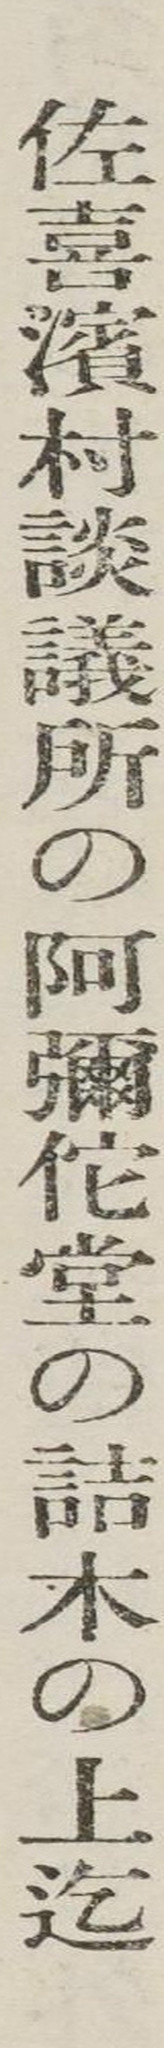佐喜浜村談議所の阿弥陀堂の詰木の上迄
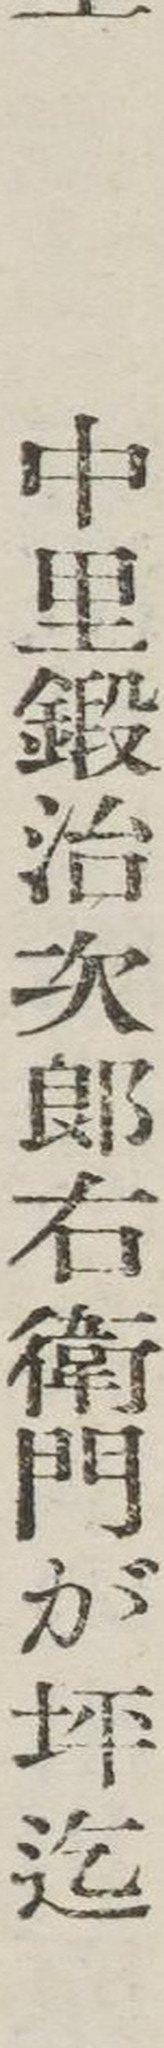同中里鍛冶次郎右衛門が坪迄

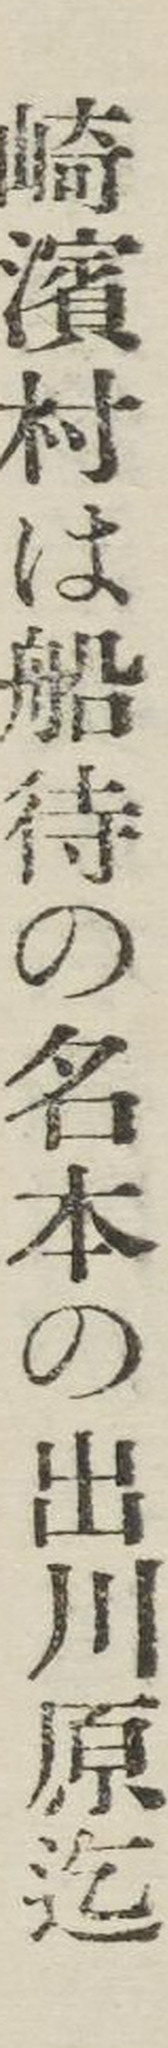同崎浜村は船待の名本の出川原迄
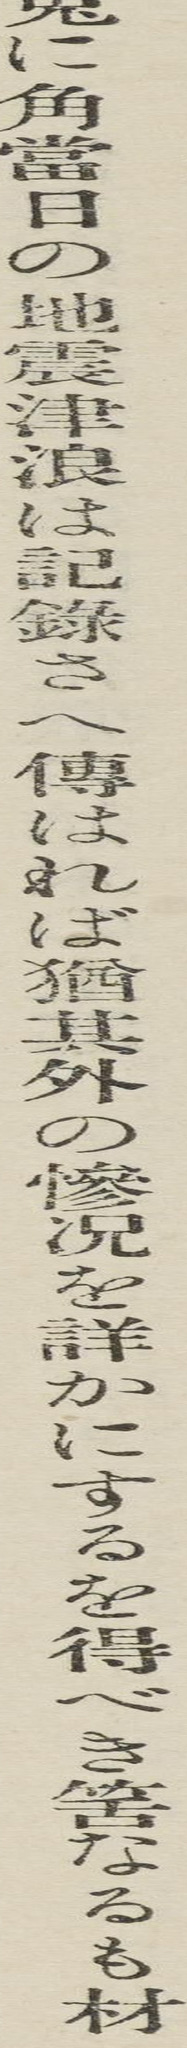兎に角当日の地震津浪は記録さへ伝はれば猶其外の惨况を詳かにするを得べき筈なるも材
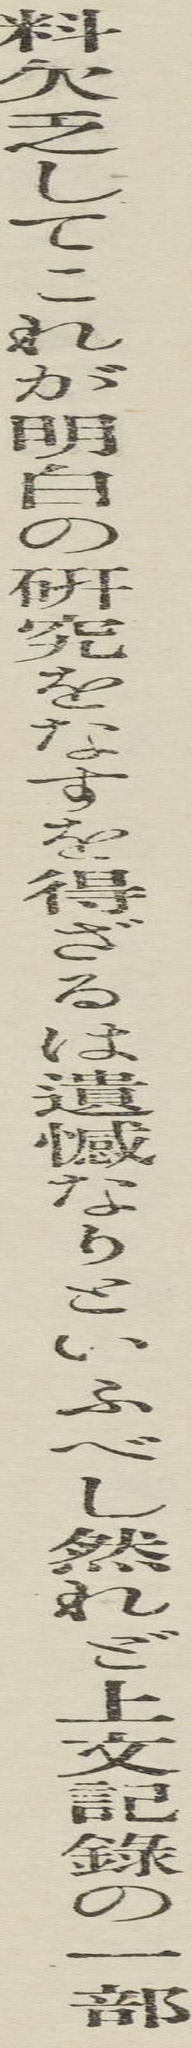料欠乏してこれが明日の研究をなすを得ざるは遺憾なりといふべし然れど上文記録の一部
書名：土佐古今ノ地震
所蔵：東京大学地震研究所図書室 Earthquake Research Institute Library, The University of Tokyo, JAPAN
